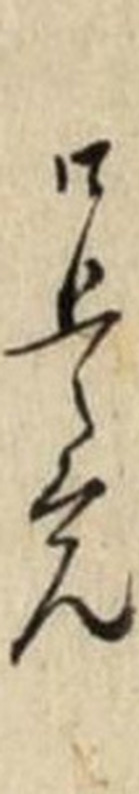口上之覚
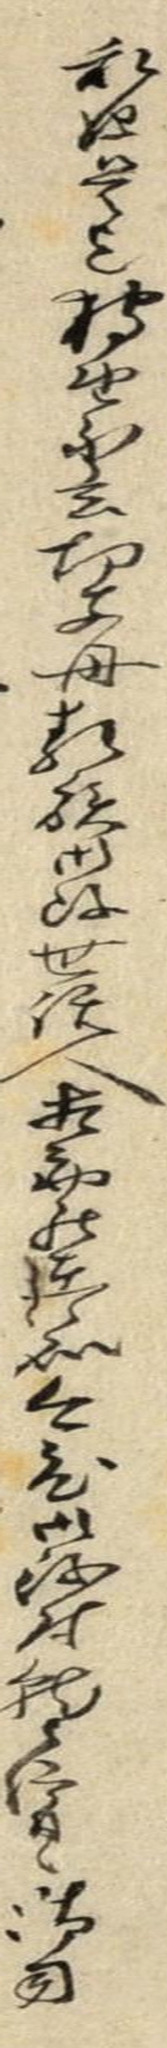私儀是迄狩野永玄切支丹類族御改世話人相勤罷在候処今度御役付就被仰付候御用
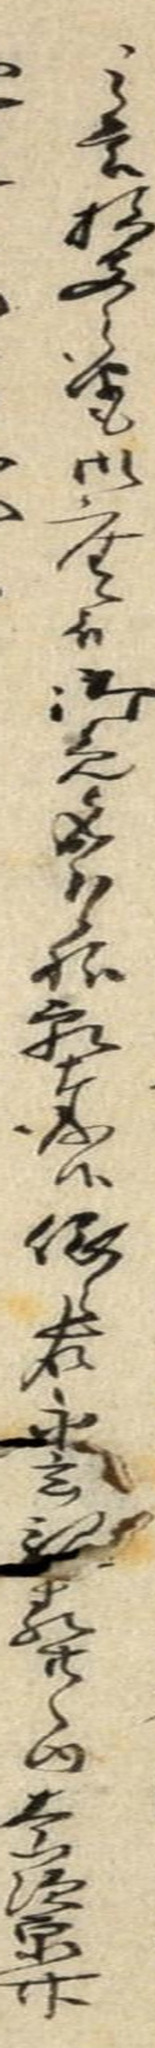之節指支之儀も御座候に付御免被成下候様願奉存候依之右永玄親類共之内奈須泉竹
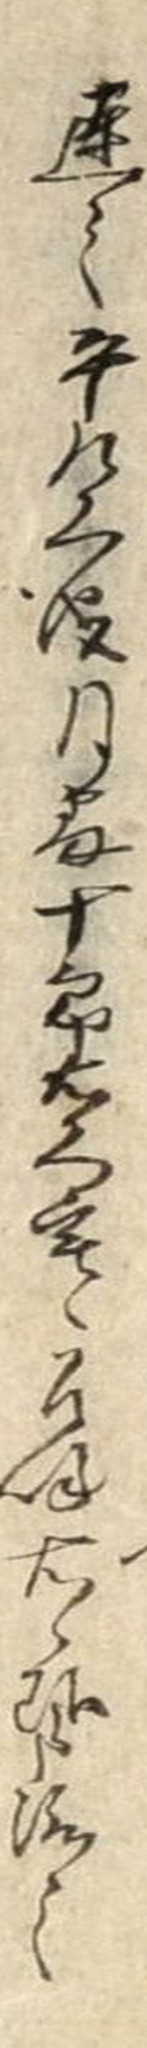達之平左衛門儀は月番十郎右衛門宅へ召呼右之趣申渡之
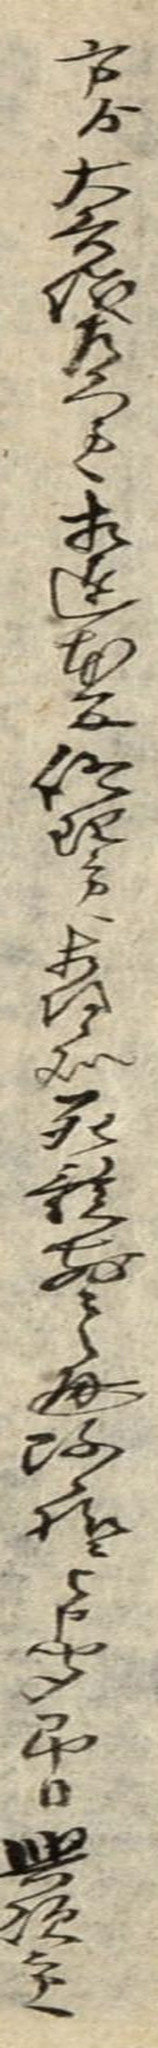方ゟ大谷儀左衛門方へ相達本多修理方へ相伺候処死骸前々之通改候様に被申聞即日興碩方へ

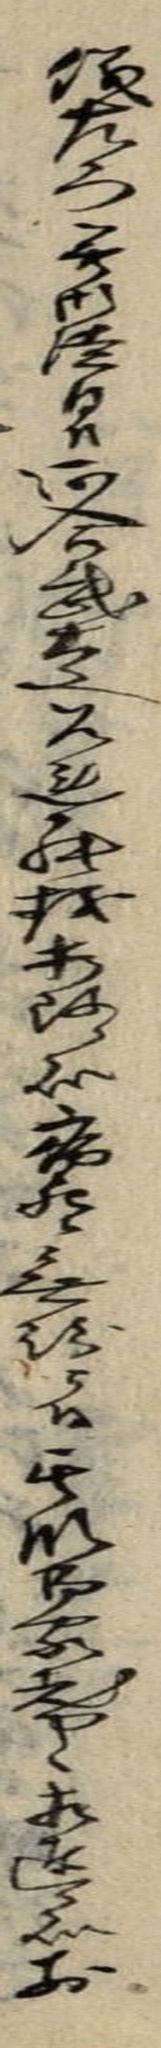儀左衛門并御徒目付河合武大夫召連罷越相改候処病死に無紛に付其段御家老中へ相達候処前
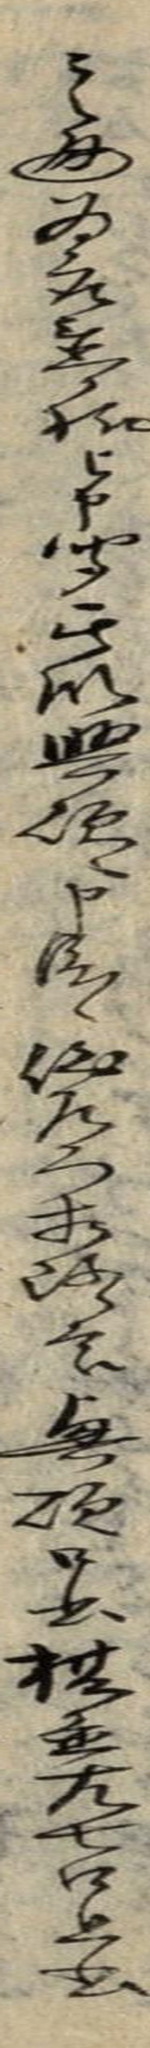々之通為取置候様被申聞其段興碩へ申渡候儀左衛門相改候節興碩口書榎並左七口上書
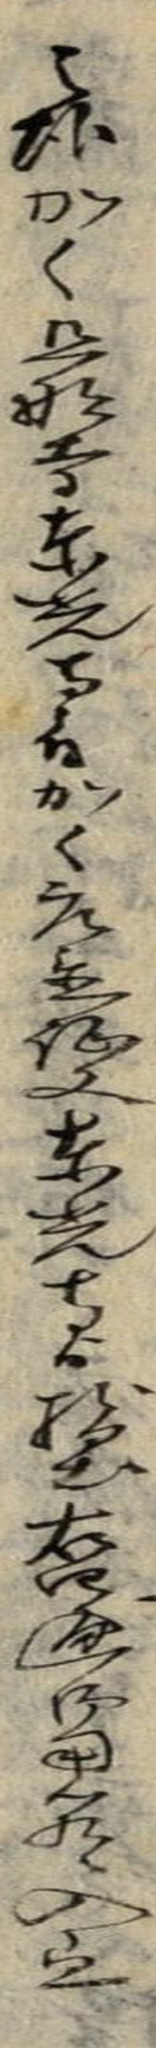之趣かく旦那寺東光寺に付かく取置証文東光寺ゟ指出右四通御用箱へ入置
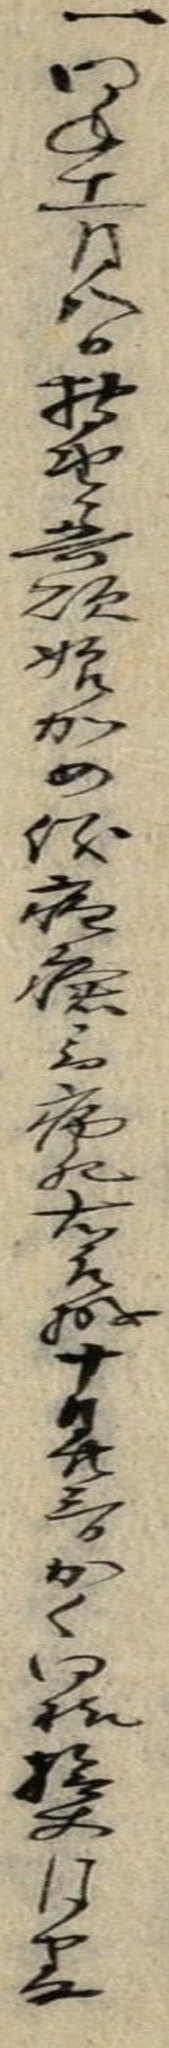一同年十一月八日狩野興碩娘かめ儀疱瘡にて病死右取扱十月廿三日かく同様検使月番
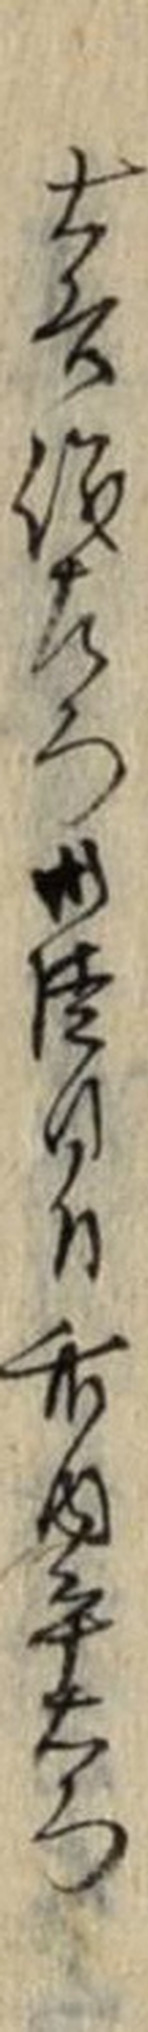大谷儀左衛門御徒目付竹内平右衛門
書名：御停止異変死失
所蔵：福井県文書館 Fukui Prefectural Archives
